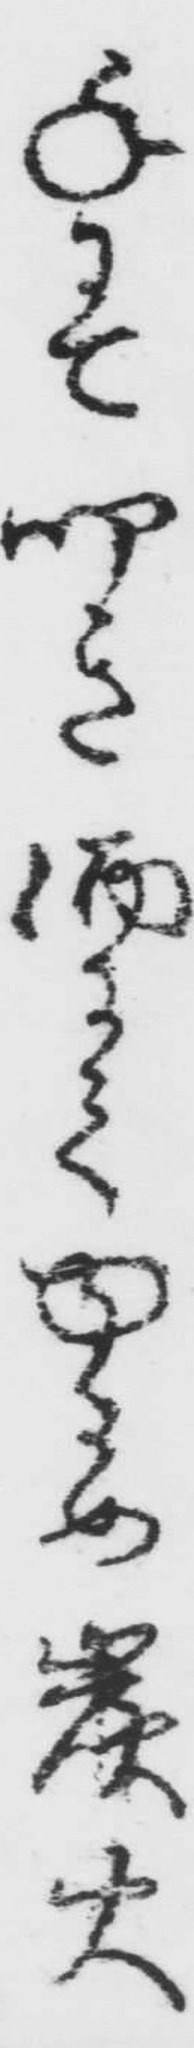ねにて叩き酒にてゆるめ炭火
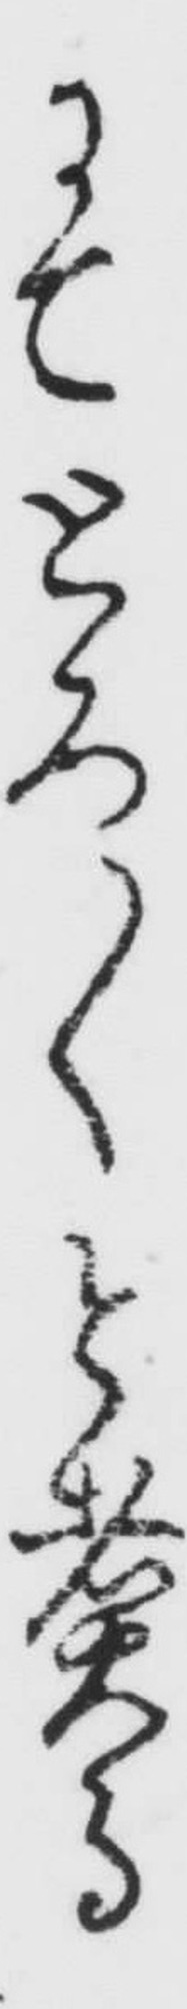にてとろ〳〵と煮る
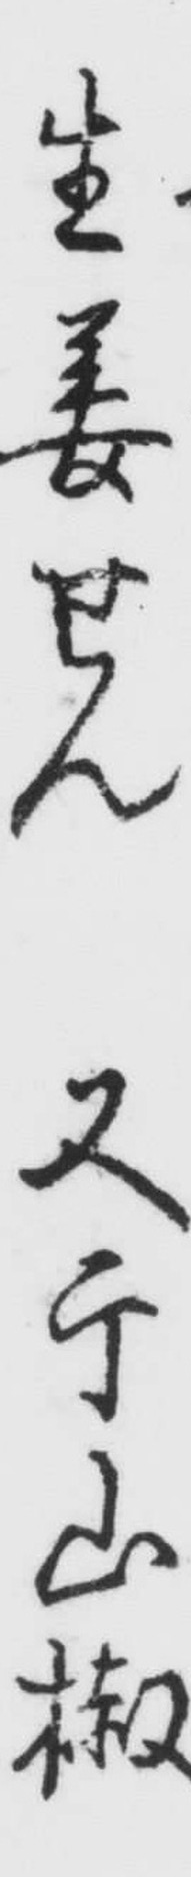生姜せん又干山椒
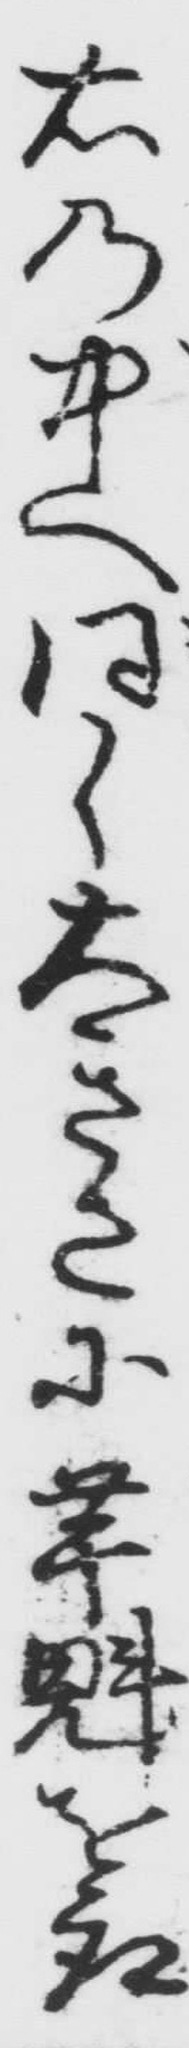右の中へ同し大きさに芋魁を取
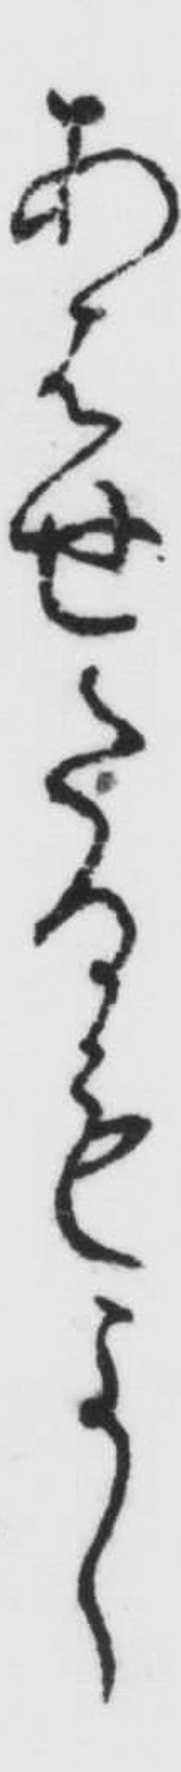あはせたるもよし
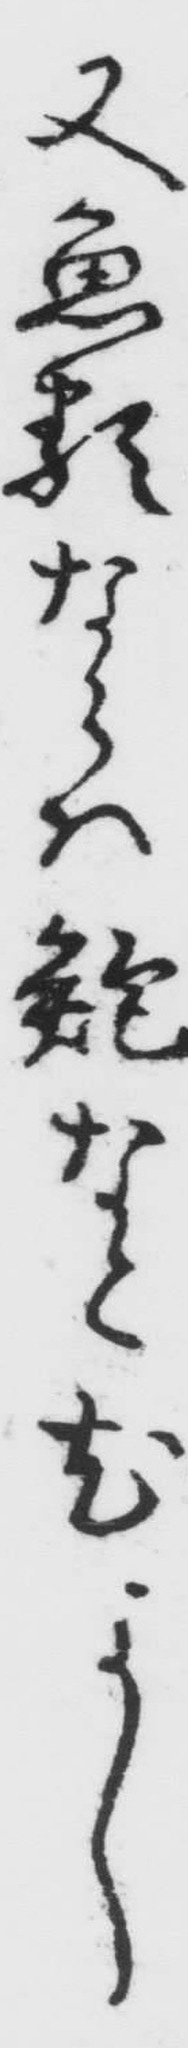又魚類ならは鮑なと尤よし
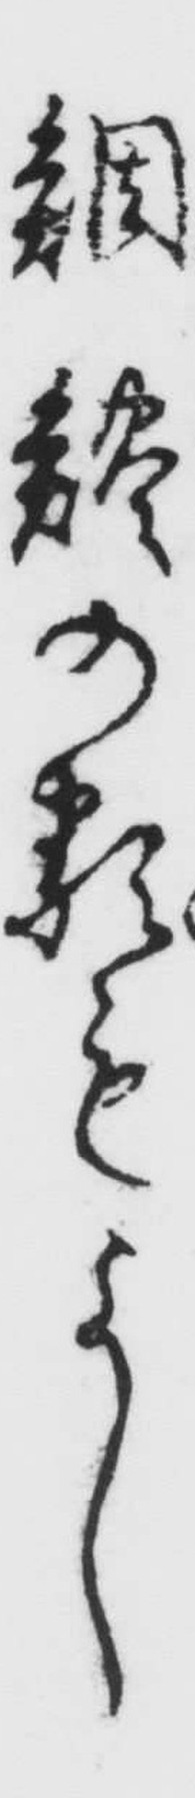鯛鱧の類もよし

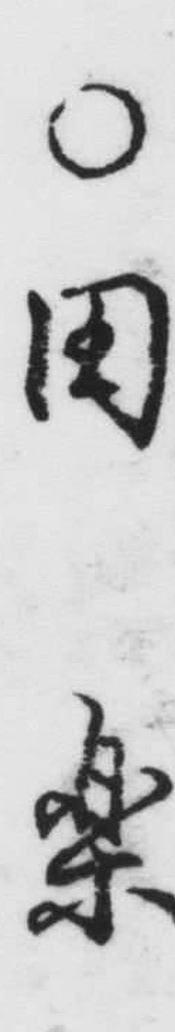○田楽
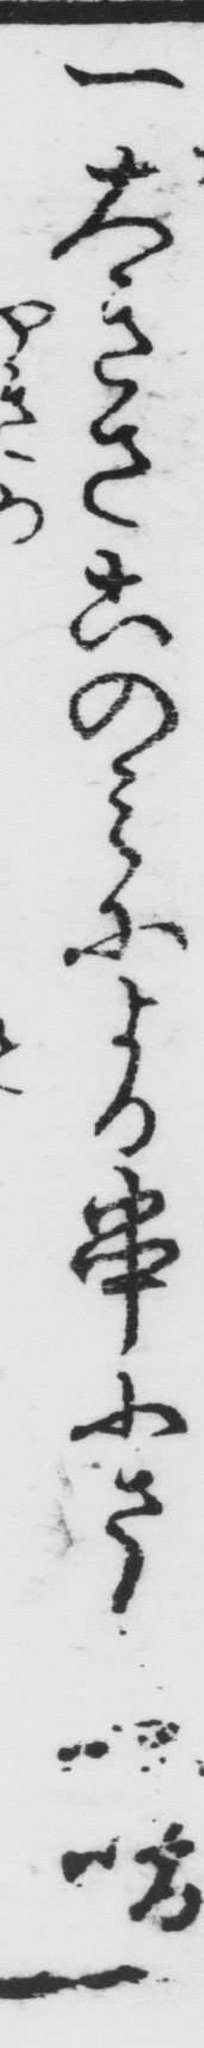一大きさこのみにより串にさし味噌
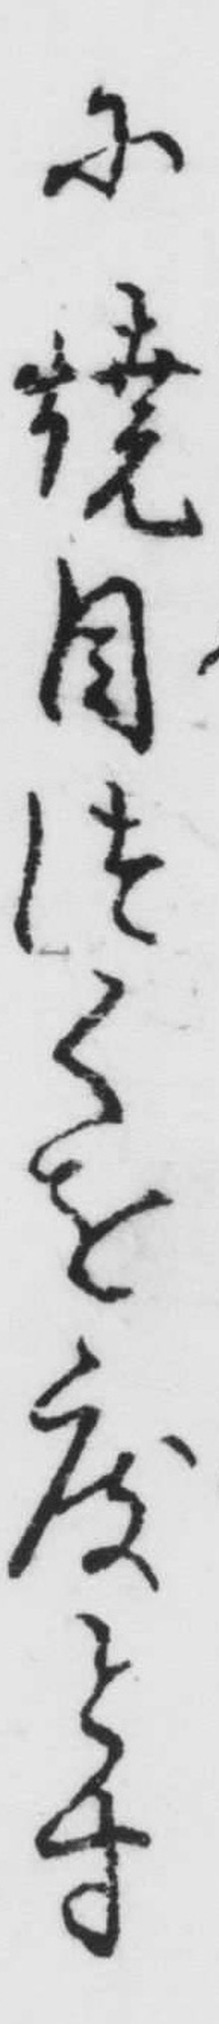に焼目つくを度とす
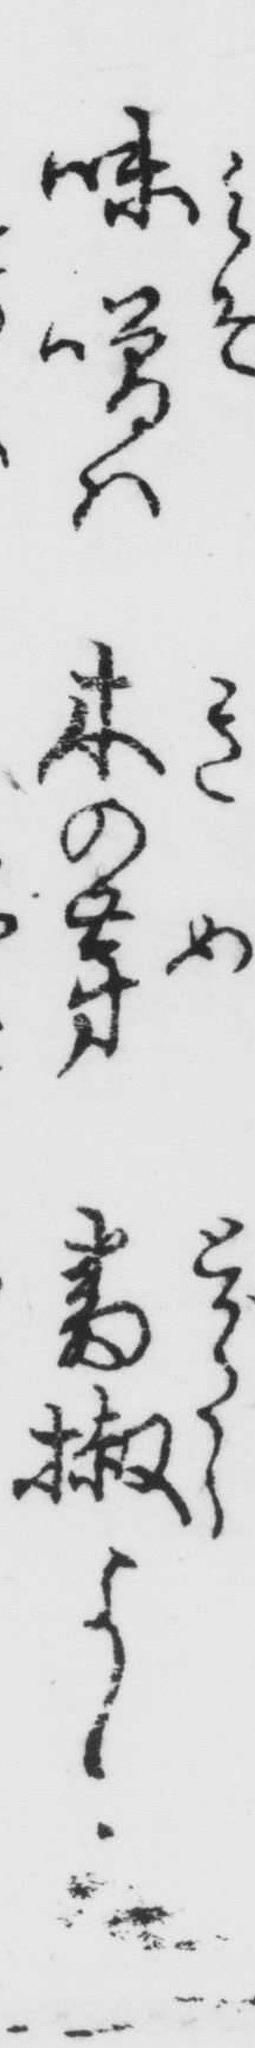味噌は木の芽番椒よし
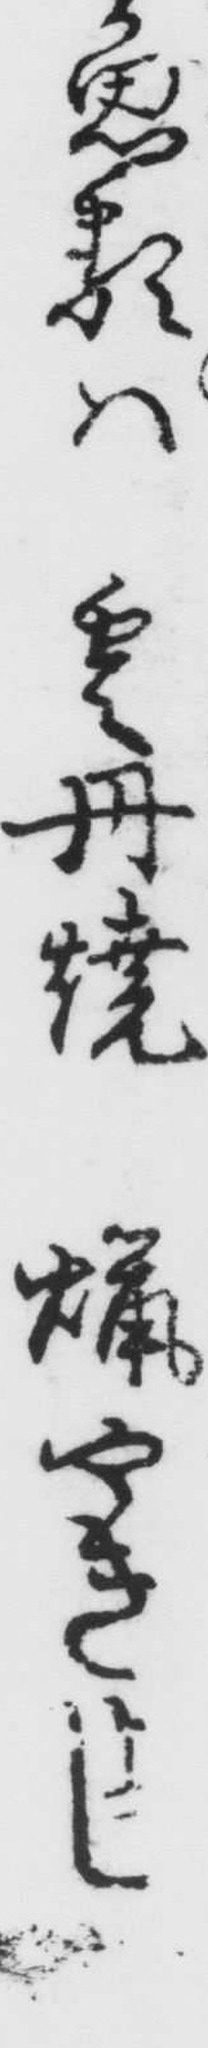魚類は雲丹焼爉やきよし
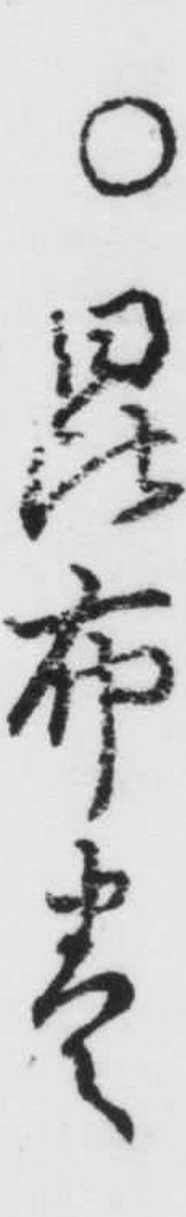○昆布巻
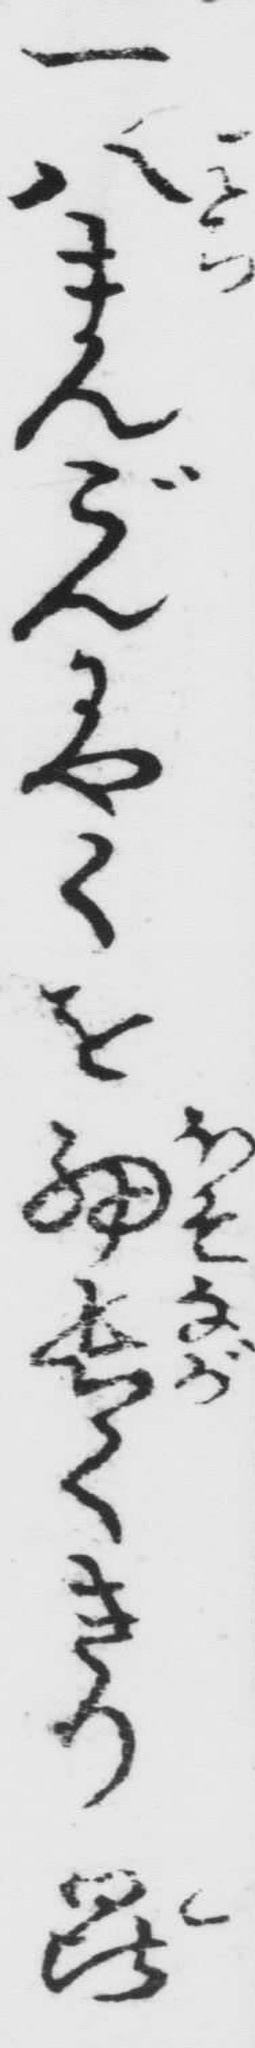一八まんごんにやくを細長くきり昆
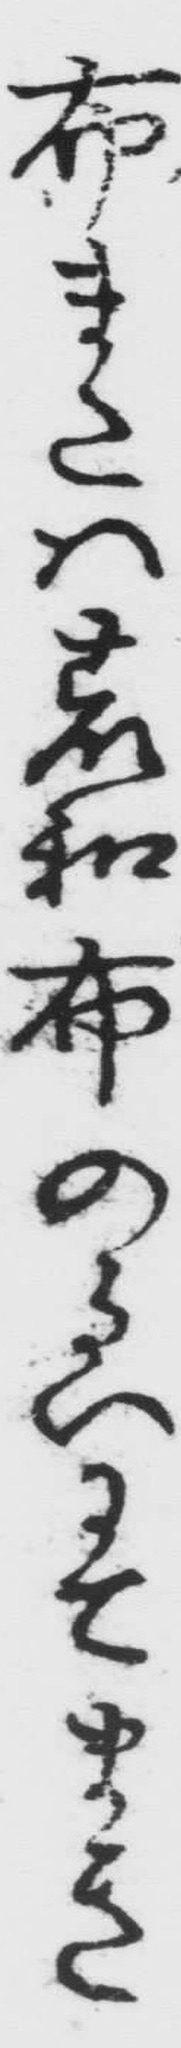布または荒和布のるいにてまき
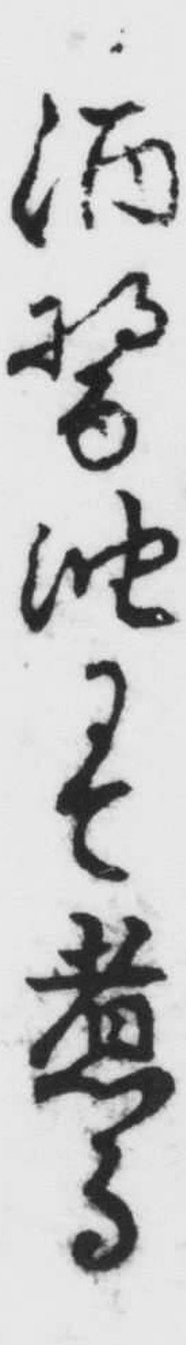酒醤油にて煮る
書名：蒟蒻百珍
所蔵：大阪府立大学学術情報センター 国文学研究資料館
